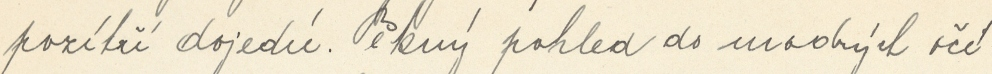pozítří dojedú. Pěkný pohled do modrých očí
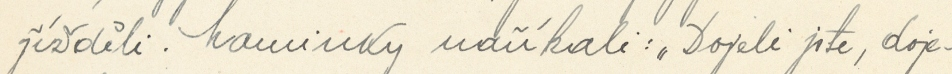jížděli. Maminky naříkali: „Dojeli jste, doje-
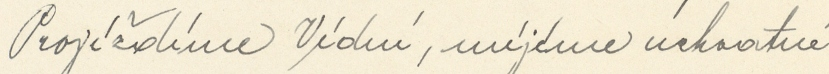Projíždíme Vídní, míjíme úchvatné
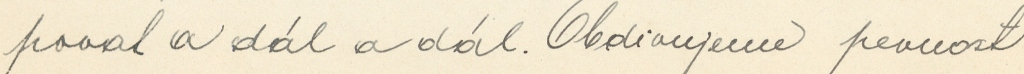povat a dál a dál. Obdivujeme pevnost
